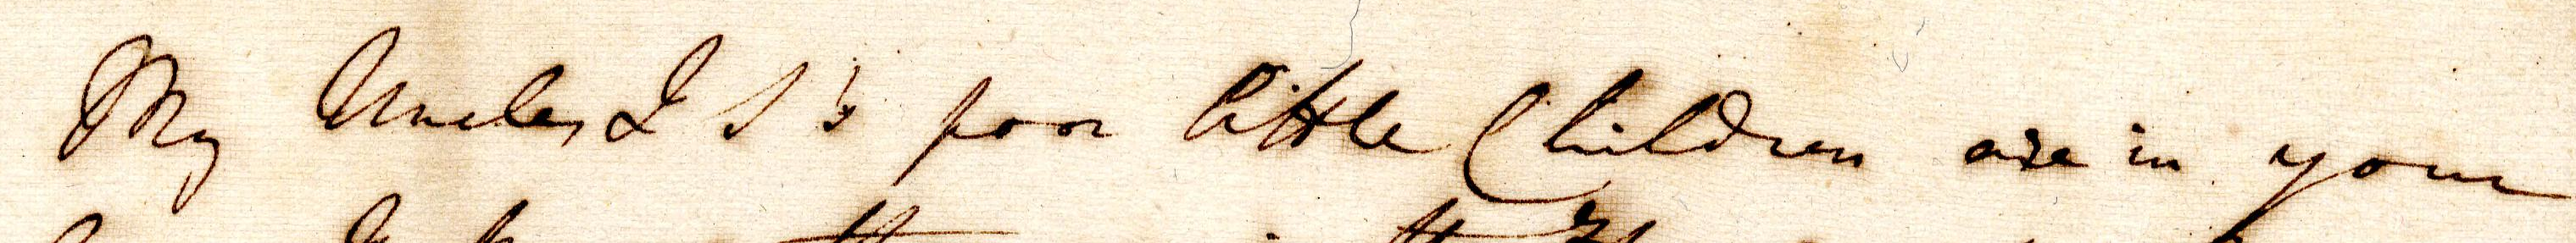My Uncle, JS's poor little Children are in your
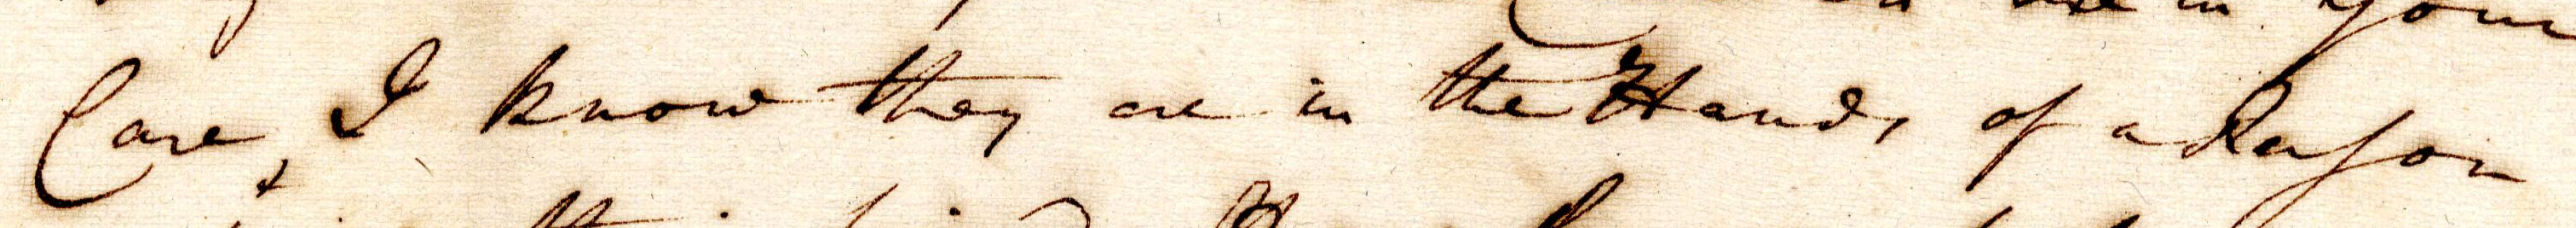Care, I know they are in the Hands of a Reason
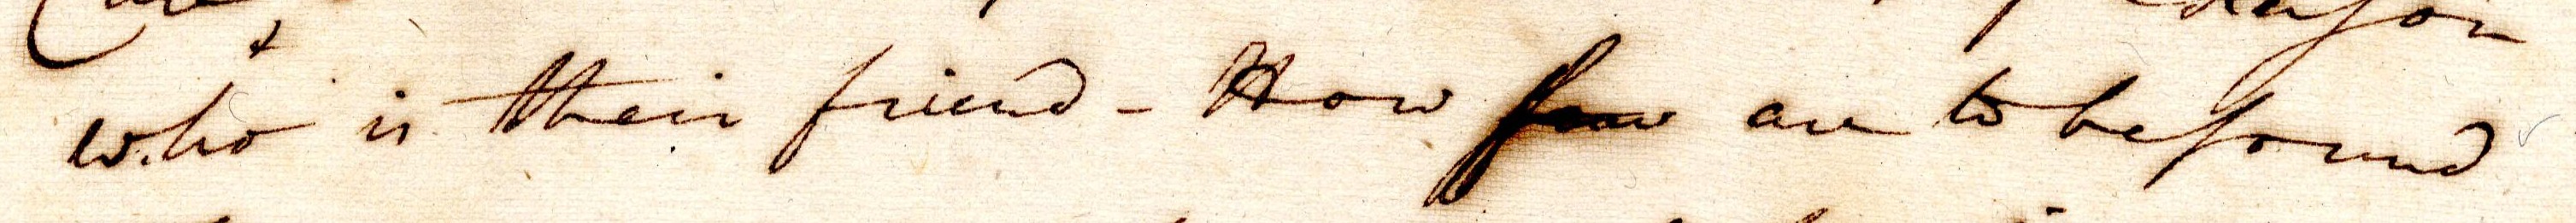who is their friend- How few are to be formed
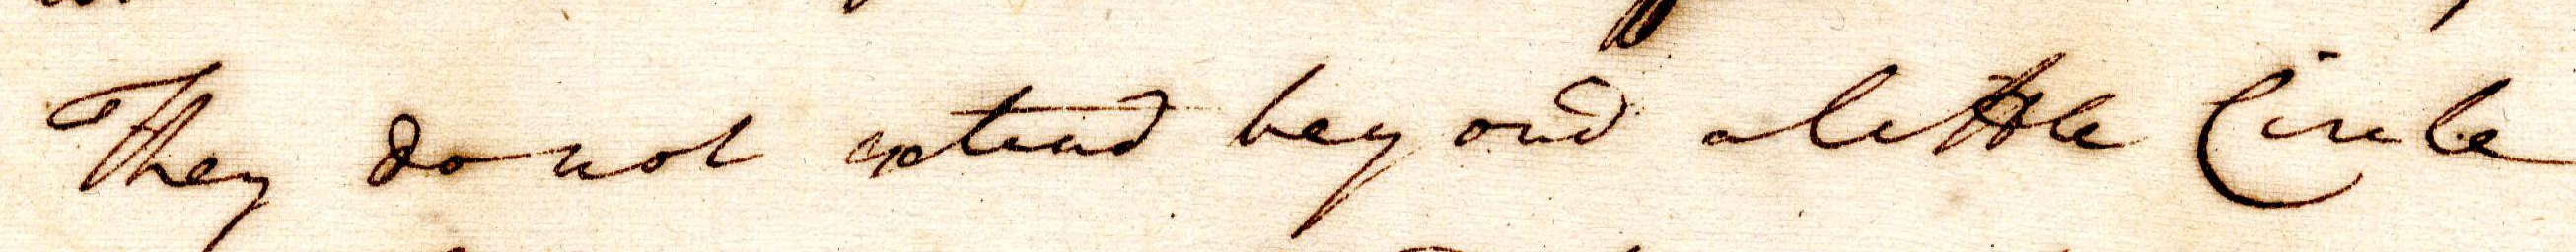They do not instead beg and a little Circle
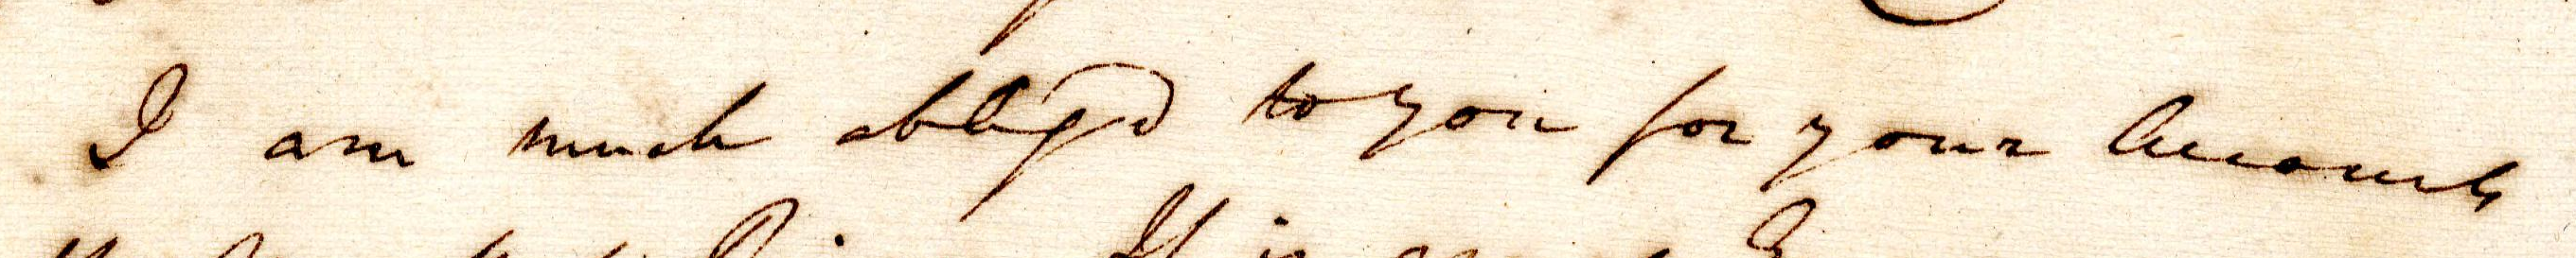I am much obligd to you for your Account
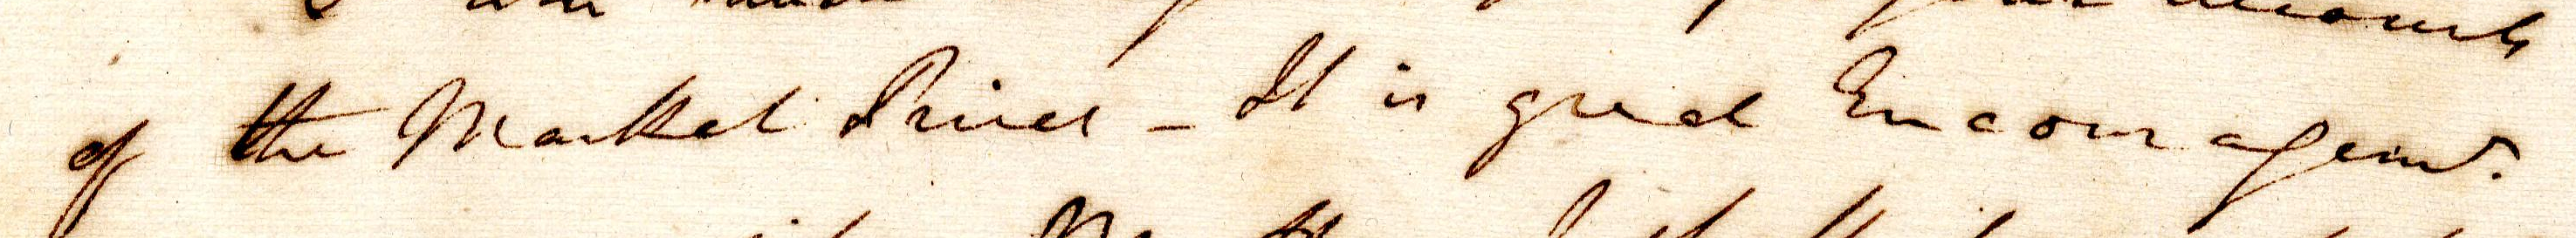of the Market River- It is great Encouragement
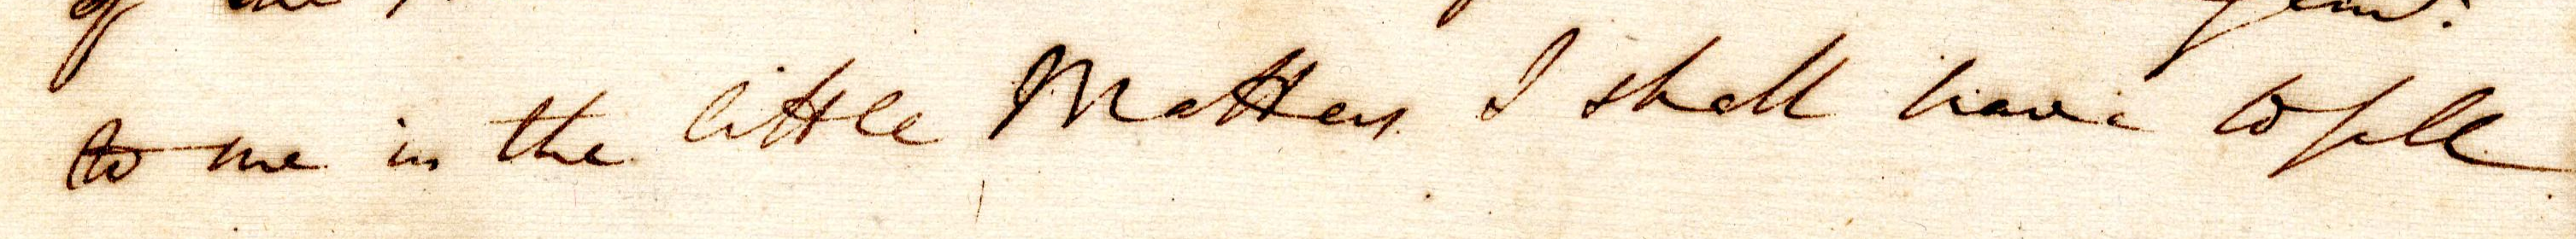to me in the little Matters I shall have to sell
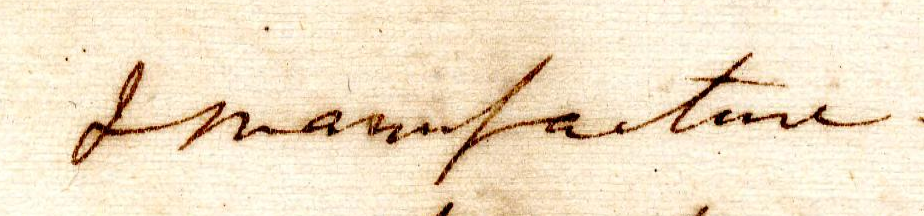& manufacture.
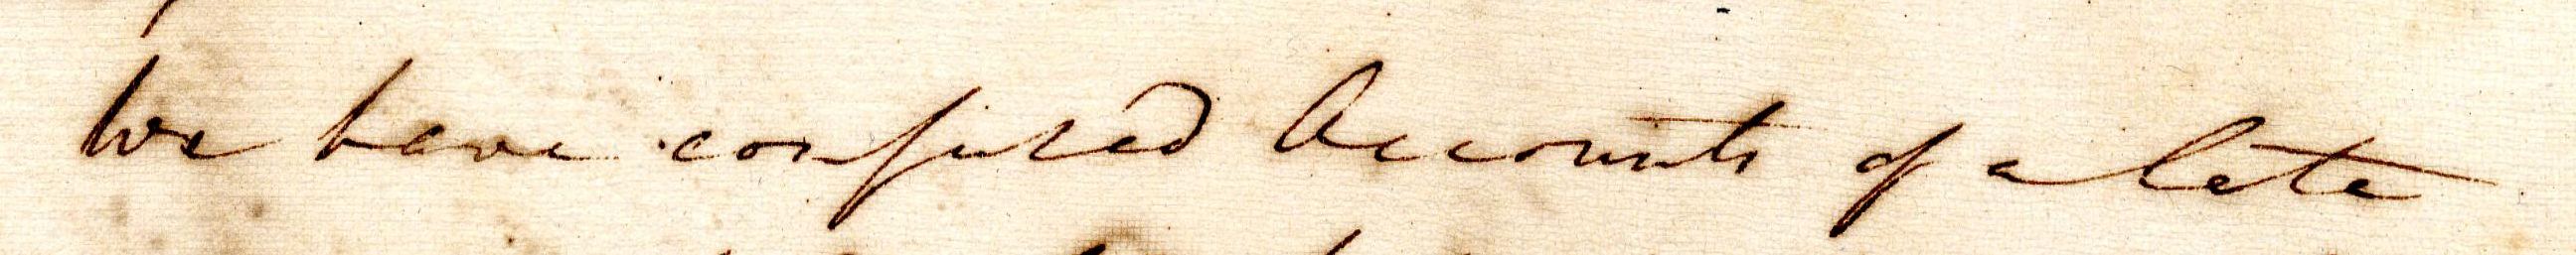We have confused Accounts of a late
